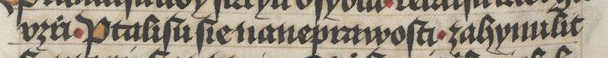vzṙi.Ptaliſu ſie naneprawoſti.zahynulit
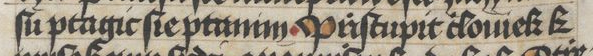ſu ptagíc ſie ptaním.Pṙiſtupít ċlouiek k
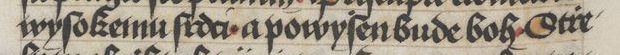wyſokemu ſrdci.a powyẛen bude boh.Stṙe¬
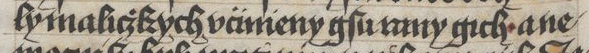ly malicżkych vċinieny gſu rany gich.ane¬
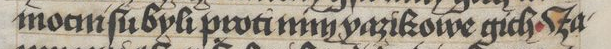mocní ſu byli proti nim yazikowe gich.Za¬
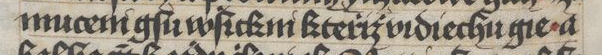muceni gſu wẛickni kteṙíż vidíechu gie.a
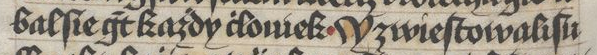bal ſie ḡt każdy ċlouiek.Y zwieſtowaliſu
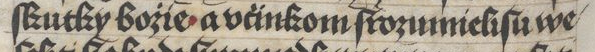ſkutky bożíe.a vċinkom ſrozumíeliſu we¬
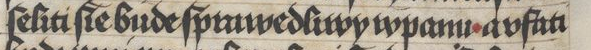ſeliti ſie bude ſprawedliwy w panu.a vſati
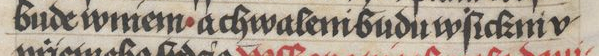bude wníem.a chwaleni budu wẛickni v¬
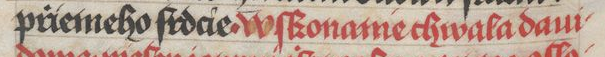pṙíemeho ſrdcie.Wſkonaníe chwala daui¬
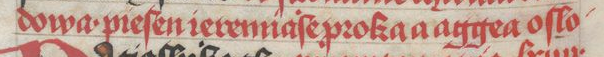dowa.pieſen ieremíaẛe ꝓroka a aggea oſlo¬
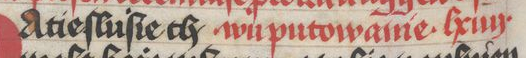A tieſluẛie ch .wu putowaníe.lxiiij.
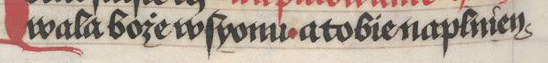wala boże wſyonu.a tobie naplnien
